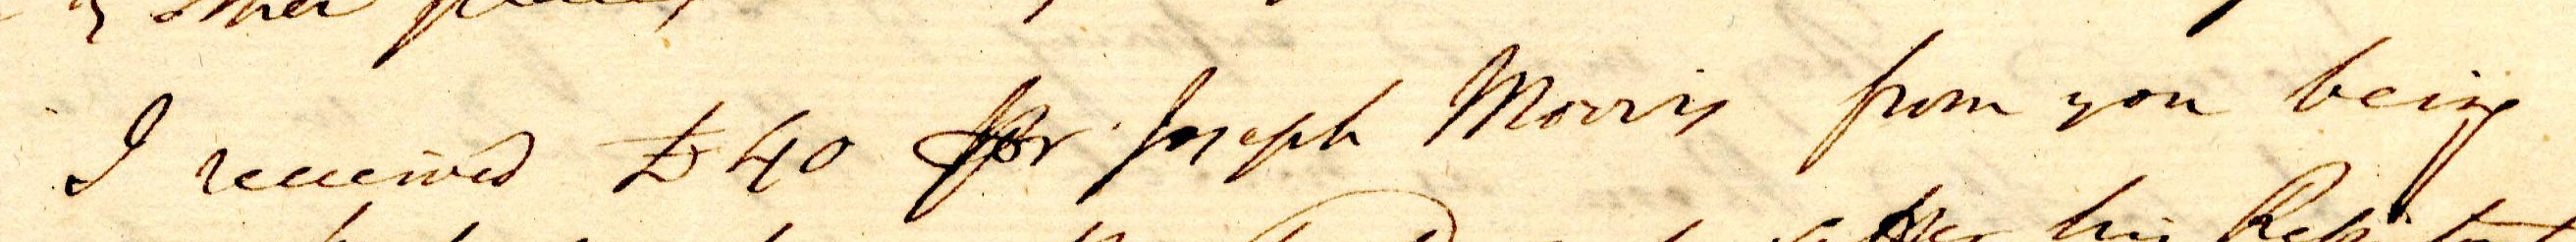I received £40 for Joseph Morris from you being
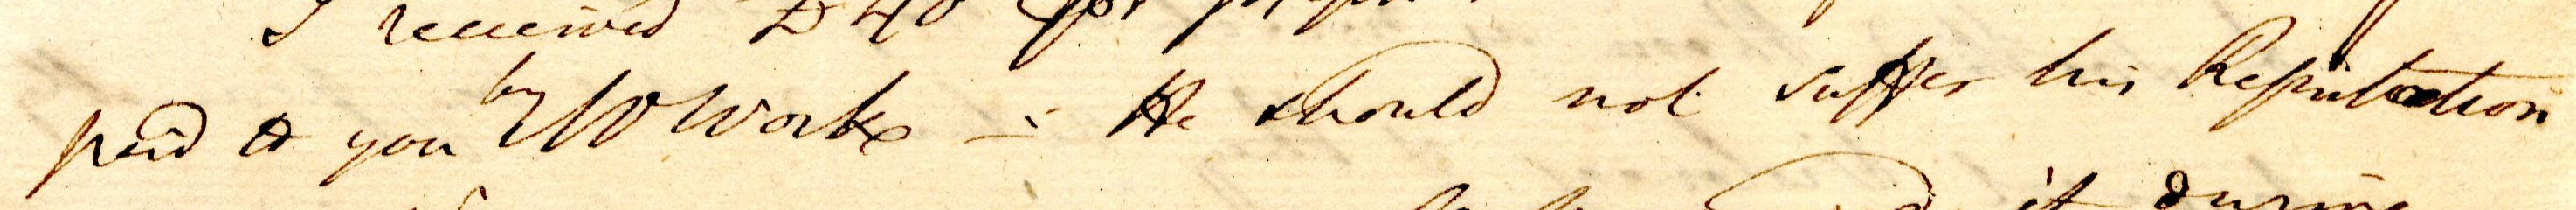paid to you by W Work. He should not suffer his Reputation
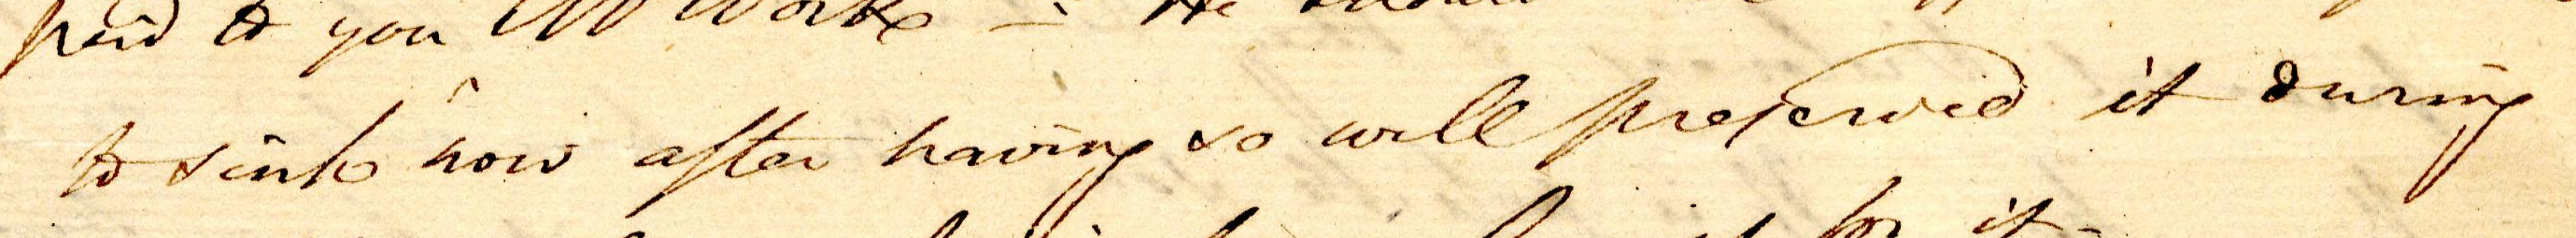to sink now after having so well preserved it during
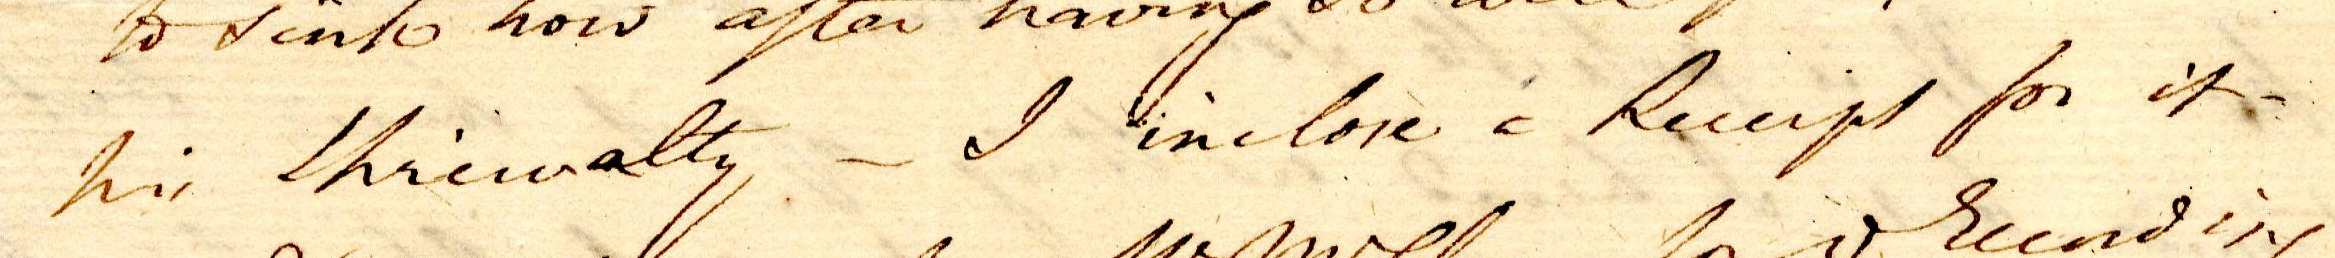his shrievalty- I inclose a Receipt for it
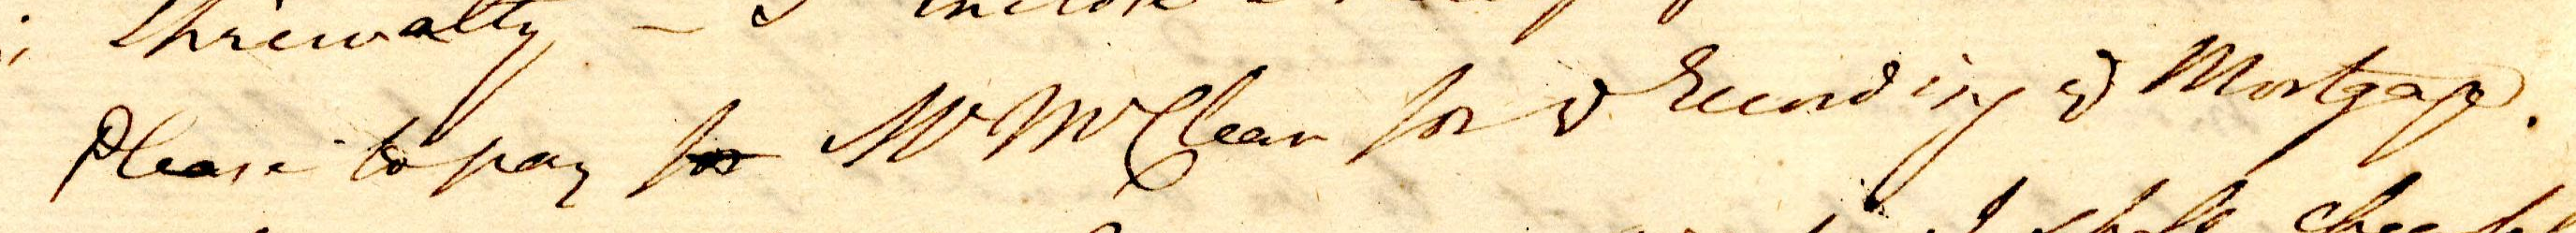Please to pay for M^r M^cClear for & recording y^e Mortgage
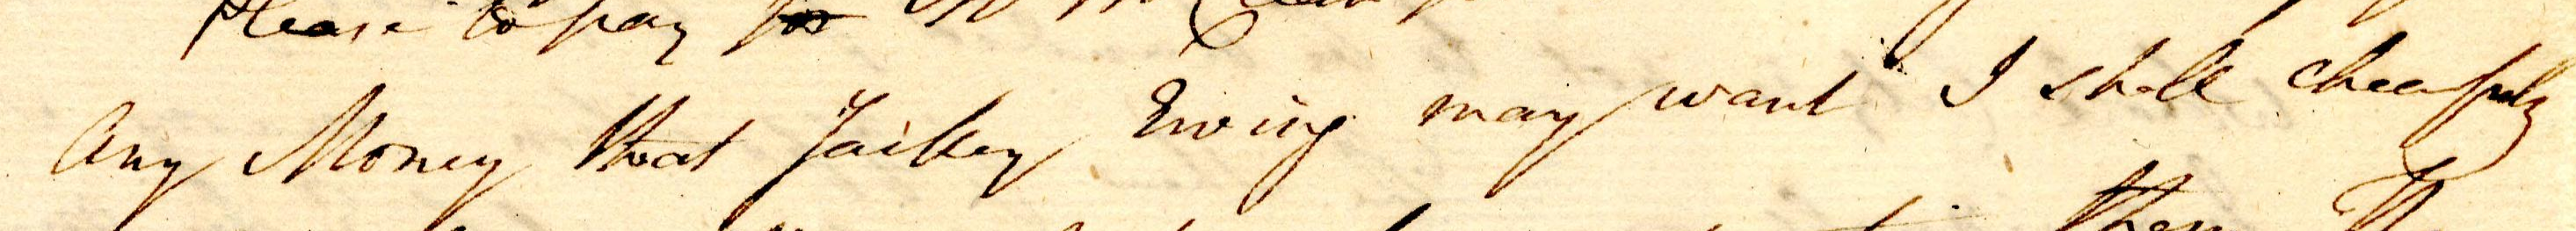Any Money that Jackey Ewing may want I shall chearfully
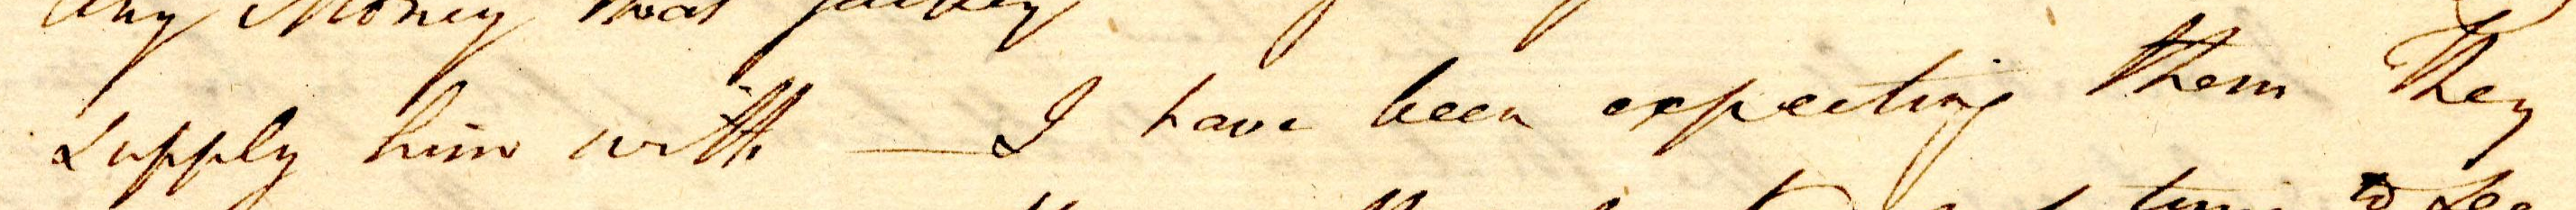supply him with. I have been expecting them They
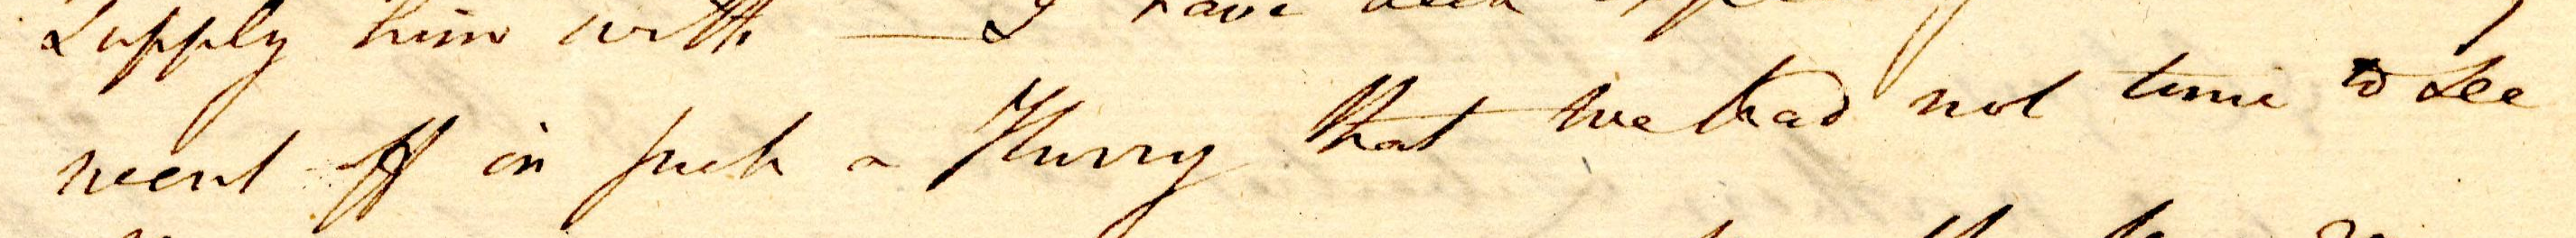went off in such a Hurry that we had not time to see
